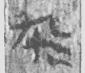九十=
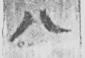八
